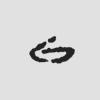㠯（以）
